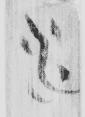水
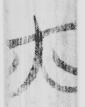火
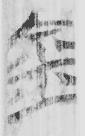金
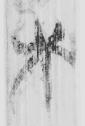木
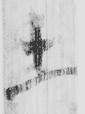土
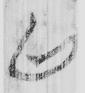㠯（以）
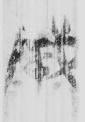成
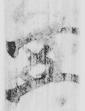五
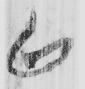㠯（以）
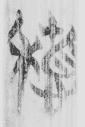{禾惪}
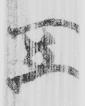五
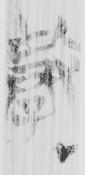{㱿子}
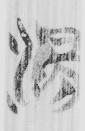湯
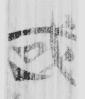或
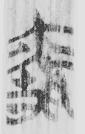{尒䎽}
